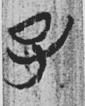子
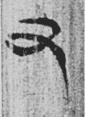又（有）
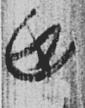臣
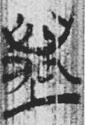○（萬）
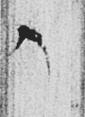人
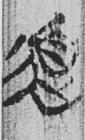道
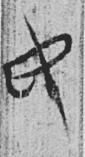女（汝）
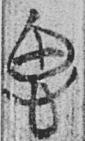思
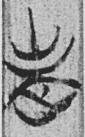老
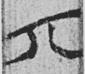亓（其）
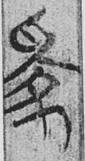○（家）
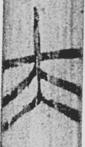夫
